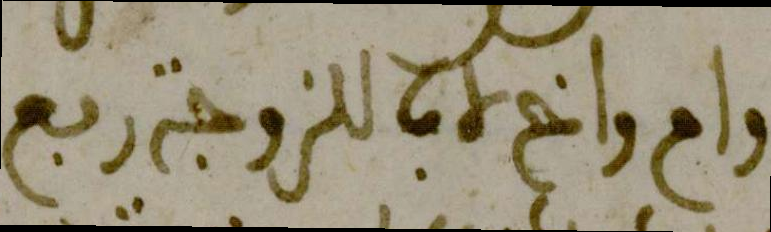وام واخ لاب للزوجة ربع
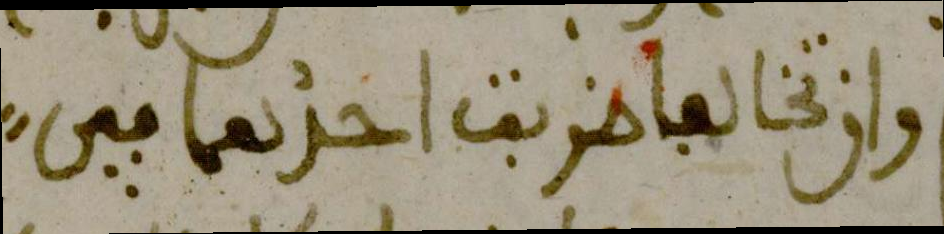وان تخالفا ضربت احدهما في
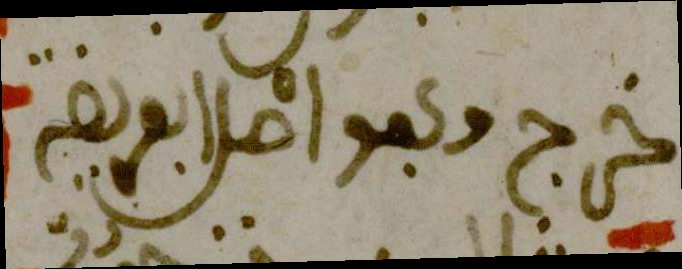خرج وهو اصل الفريضة
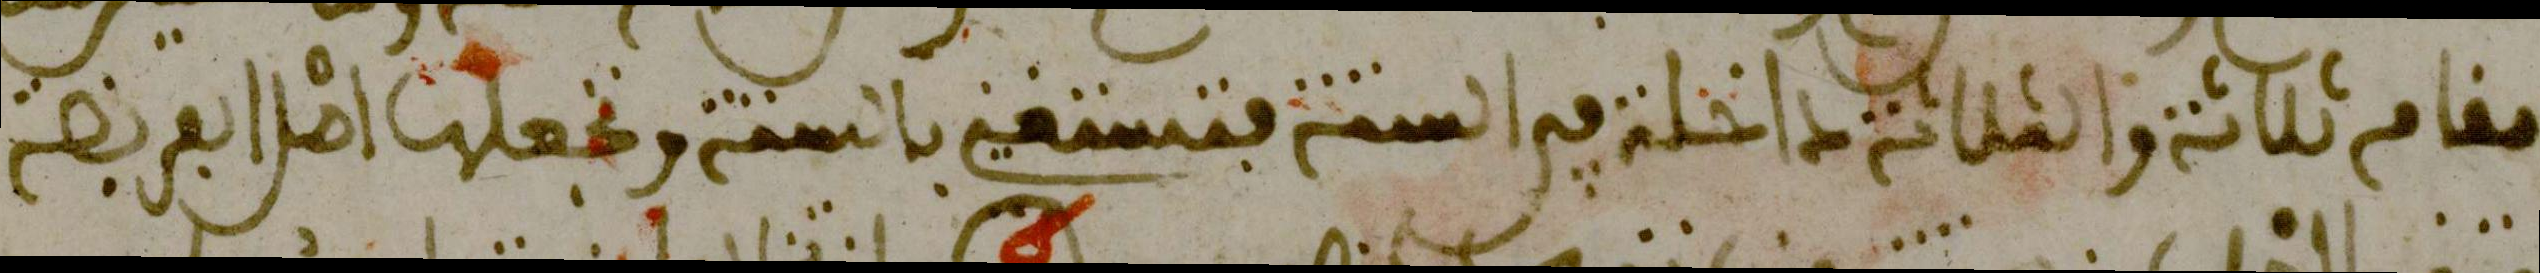مقام ثلاثة والثلاثة داخلة في الستة فتستغني بالستة وتجعلتها اصل الفريضة
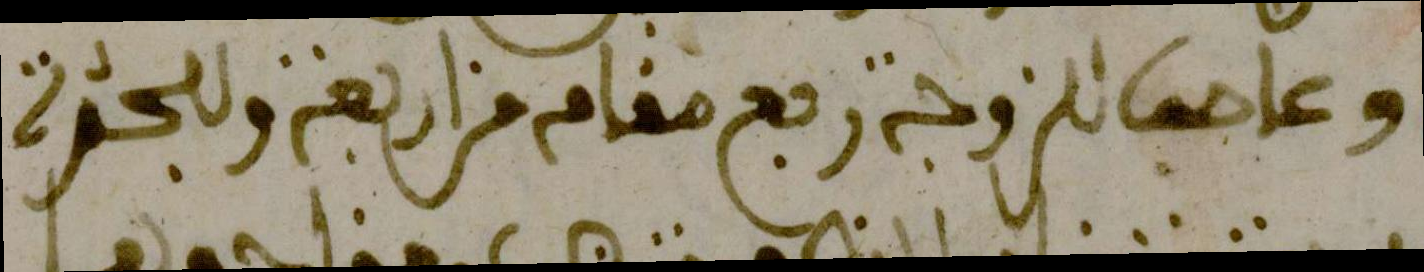وعاصب للزوجة ربع مقامه من اربعة وللجدة
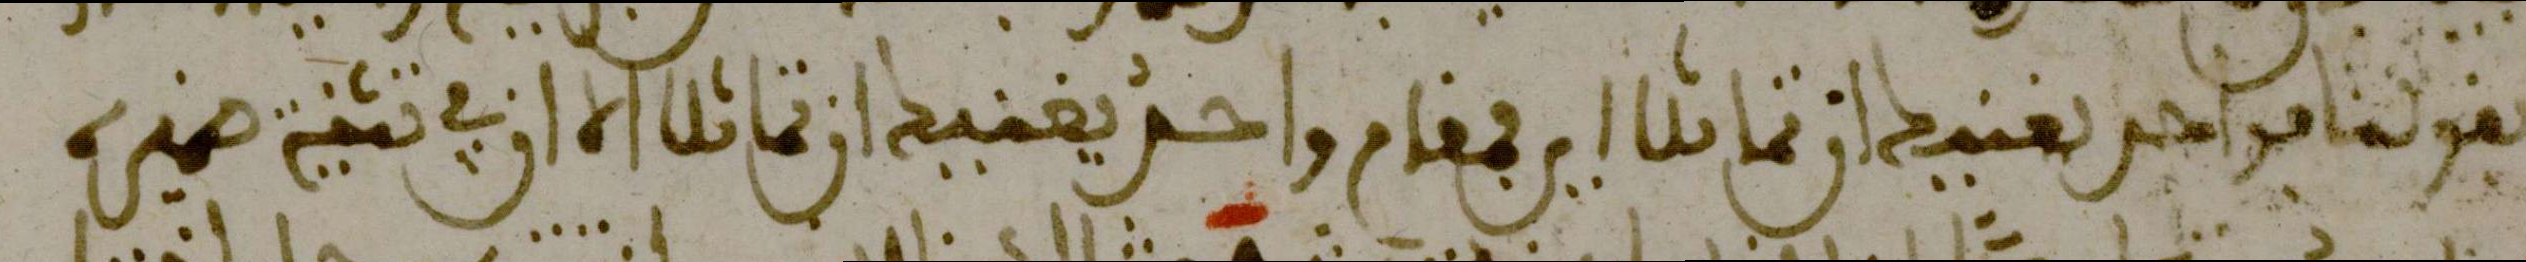بقولنا فواحد يغنيك ان تماثلا اي فمقام واحد يغنيك ان تماثلا الا ان في تثنية ضميره
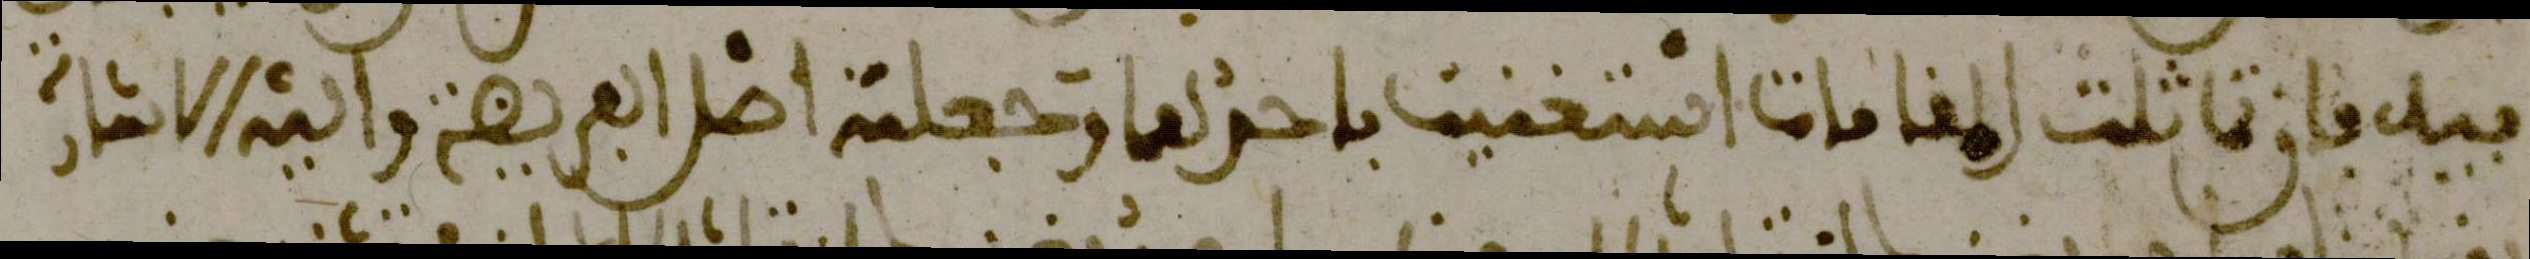فيه فان تماثلت المقامات استغنيت باحدهما وجعلته اصل الفريضة واليه الاشارة
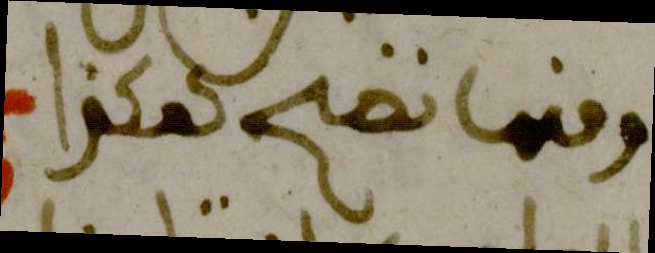منها تصح هكذا
